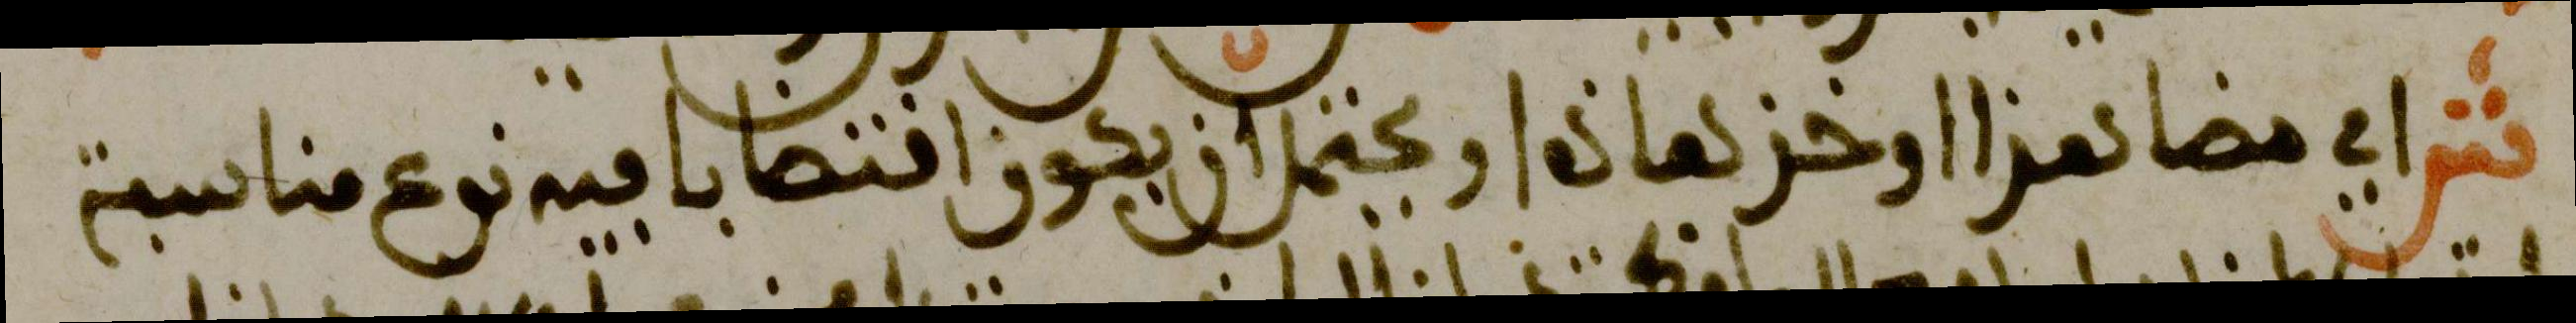ش اي مضا هذا او خذ هاذا ويحتمل ان يكون اقتضابا فيه نوع مناسبة
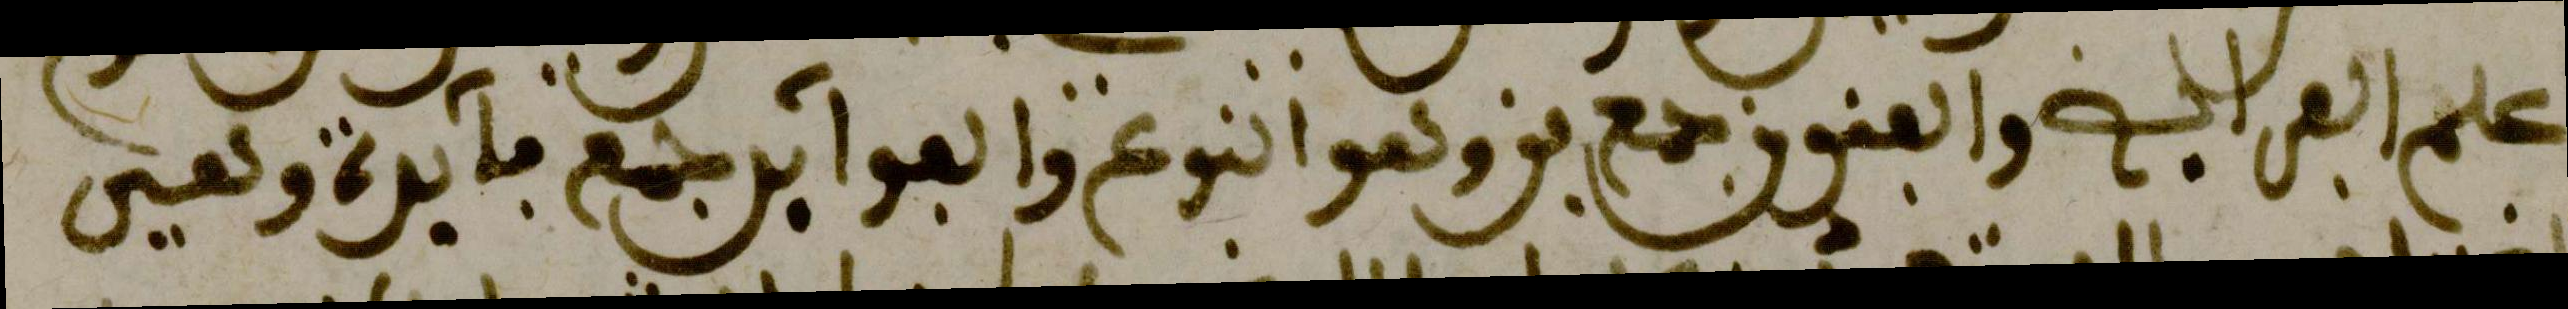علم الفرائض والفنون جمع فن وهو النوع الفوائد جمع فائدة وهي
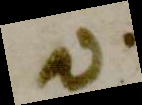له
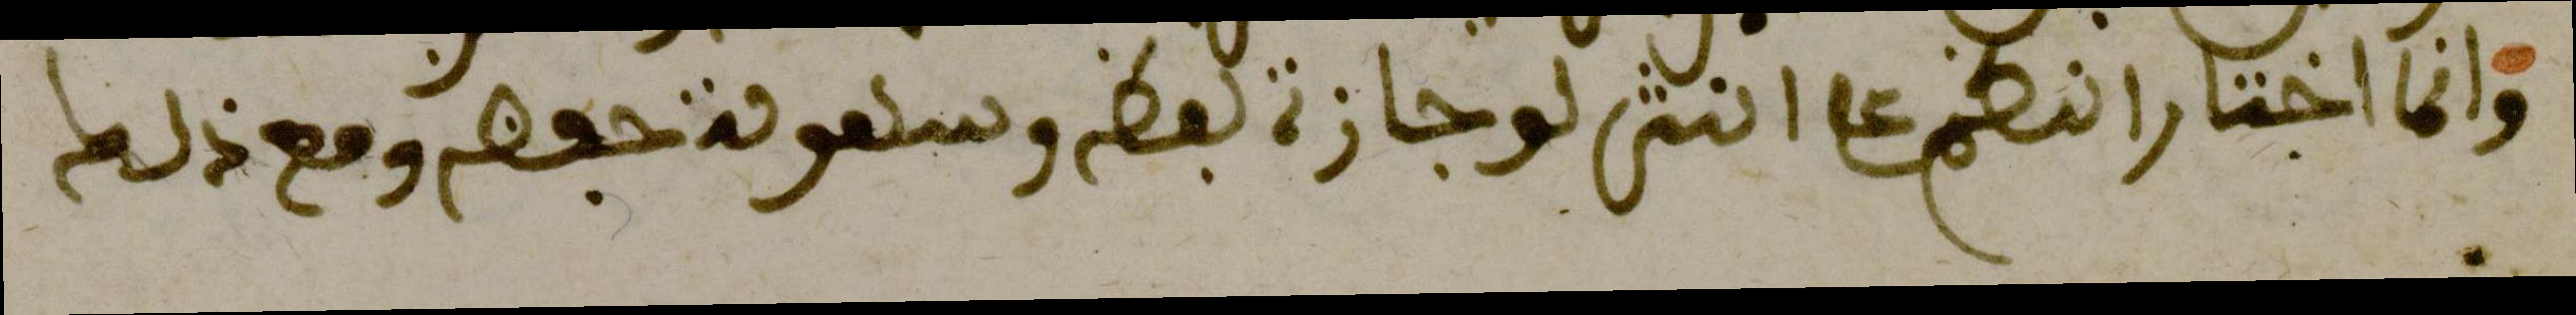وانما اختار النظم على النثر لو جازة لفظه وسهولة حفظه ومع ذلك
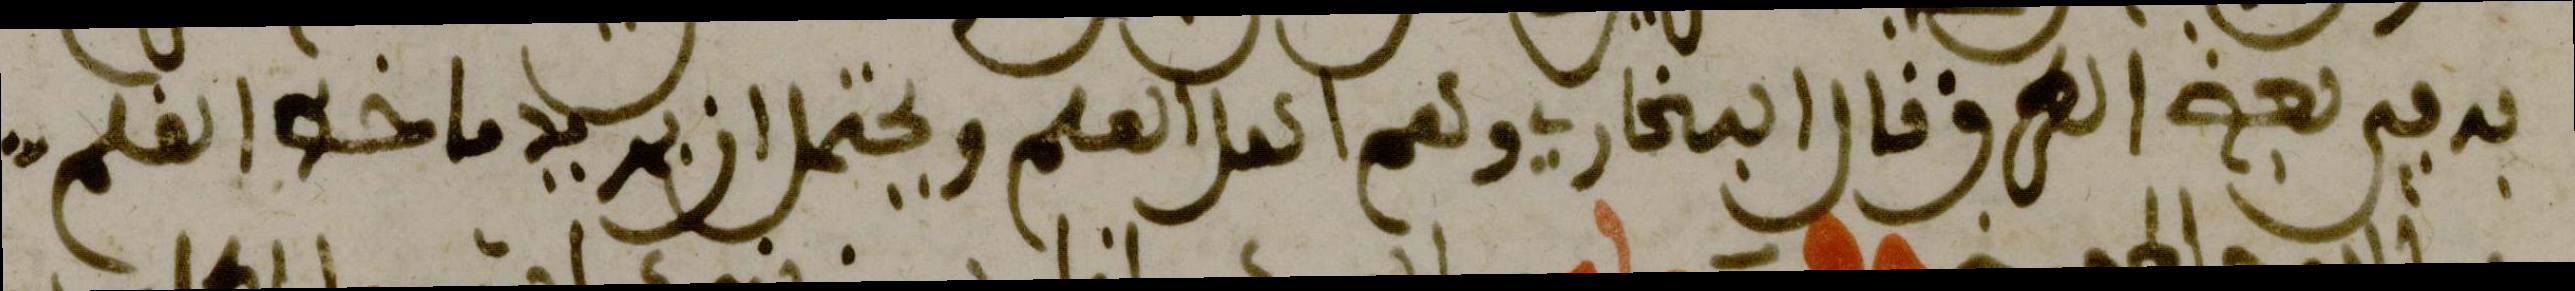به في بعض الطرق قال البخاري وهم اهل العلم ويحتمل ان يريد ماخط القلم
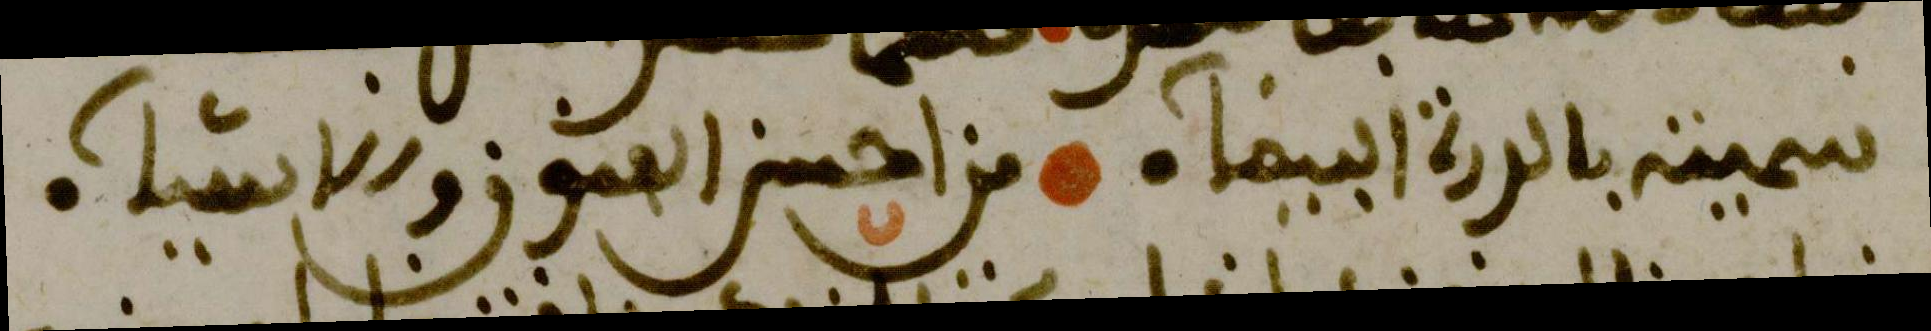سميته بالدرة البيضاء من احسن الفنون ولاشياء
